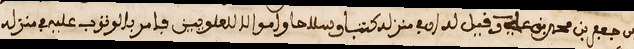بن جعفر بن محمد بن علي وقيل له ان في منزله كتبا وسلاحا واموالا للعلويين فامر بالوتوب عليه في منزله
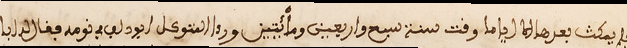فلم يمكث بعدها الا اياما وقت سنة سع واربعين ومائتين ورءا المتوكل ابو دلف في نومه فقال له ابا
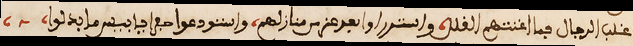غلب الرجال فما اغنتهم القلل واسترراوا بعد منازلهم واستودعوا حفرا يا بيس ما بدلوا
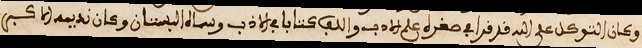وكان التوكل عدى الله قد قرا في صغره علم الادب واللف كتابا في الاذب وسماه البستان وكان نديمه الاكبر
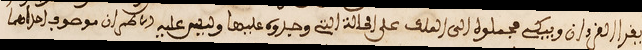يقرا القرءان ويبكى فجملوه الى الملك على الحالة التي وجدوه عليها وليس عليه الا طمران موصوف احداهما
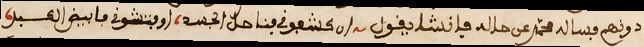دونهم فساله محمد عن حاله فانشا يقوله ان كشفونى فناحل الجسد او فتشونى فابيض الكبد
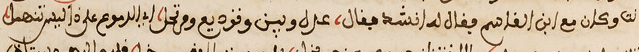انت وكان مع ابن القاسم فقال له انشد فقال عده وبين وتوديع ومن تحل اي الدموع على ذا ليس تنهمل
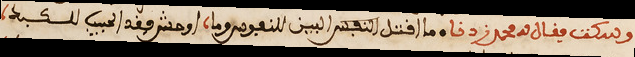وسكت فقال له محمد زدنا ما اقتل النفس البين للنفوس وما اوحش وقد الحبيب للكمد
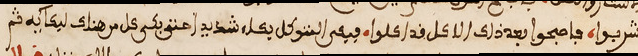شربوا فاصبحوا بعد ذاك الاكل قد اكلوا فبكى المتوكل بكاء شديدا حتى بكى كل من هناك لبكايه ثم
